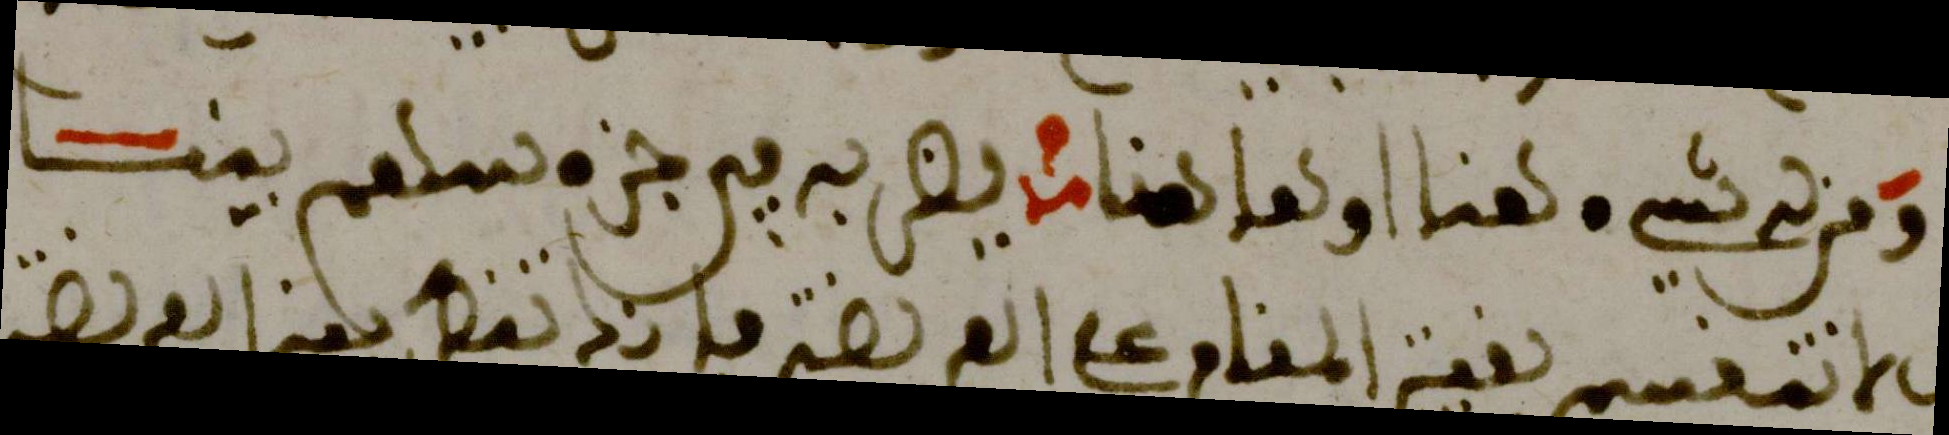ومن له شيء هنا اوهاهنا يضربه في جزء سهم بينا
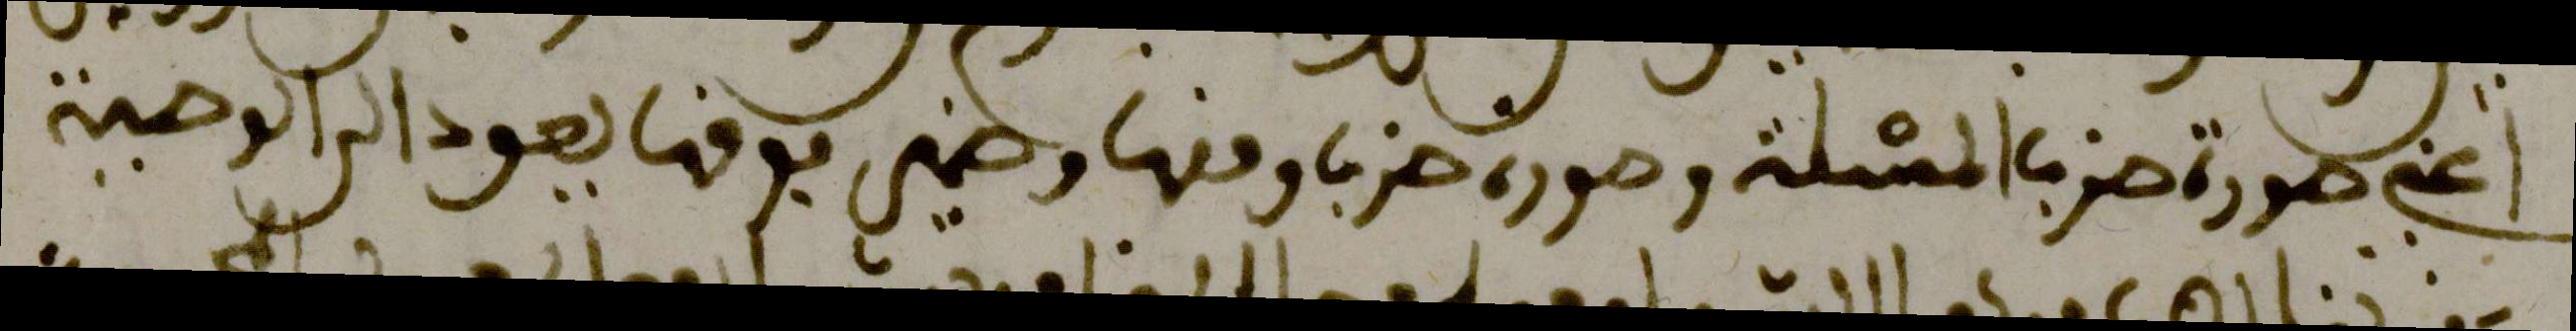اعنى صورة ضرب المسلة وصورة ضرب ومنها وضمير فوقها يعود الى الوصية
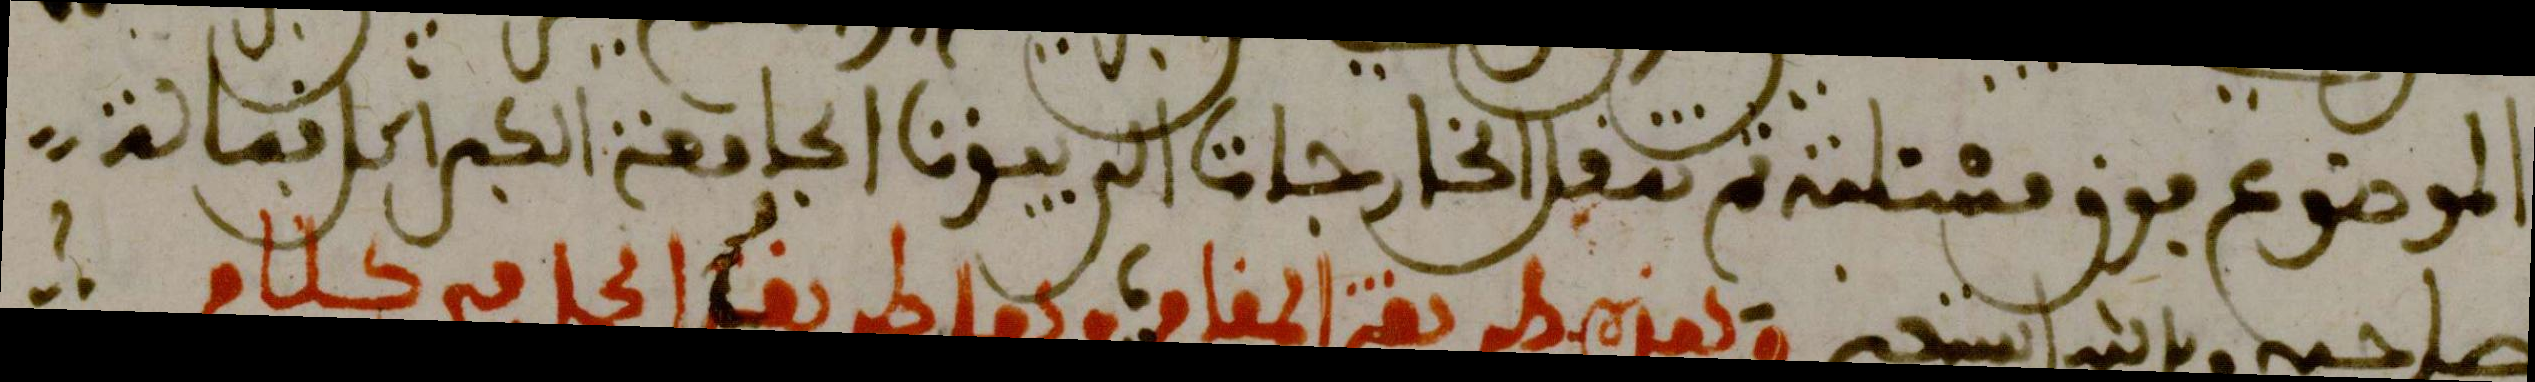الموضوع فوق مسئلته ثم تنقل الخارجات الى بيوت الجامعة الكبرا كل قبالة
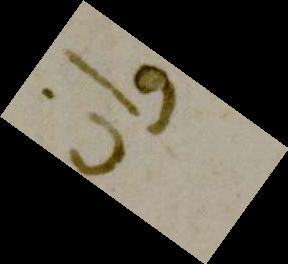وان
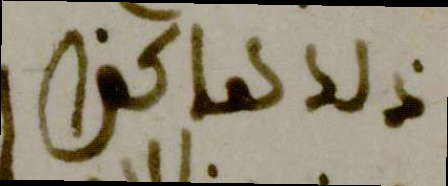ذلك هاكذا
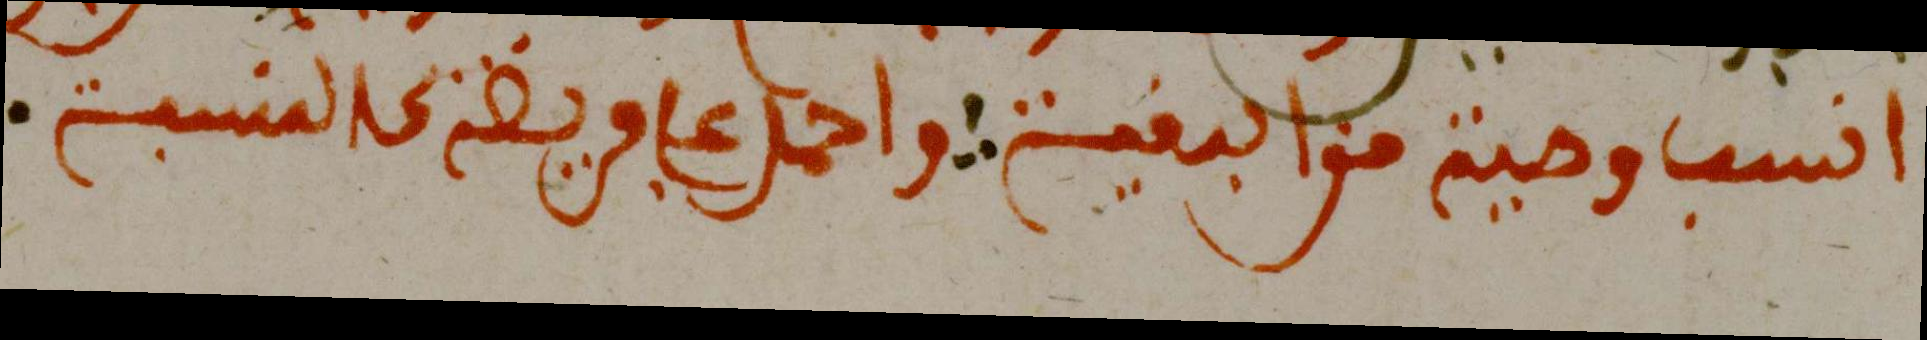انسب وصية من البقية واحمل علي فريضة كالنسبة
